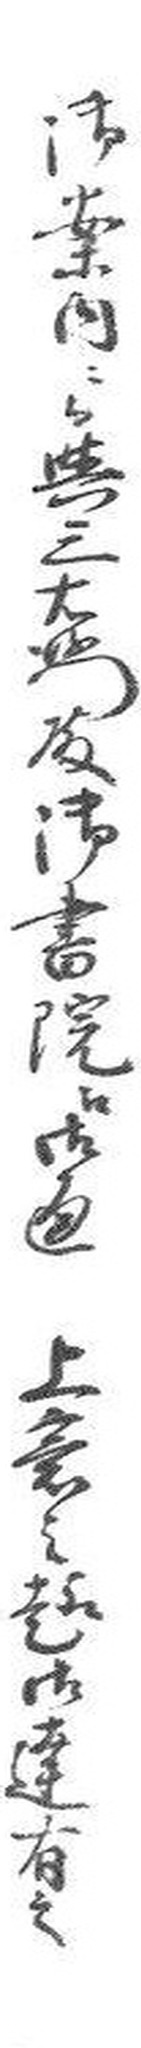御案内ニ而輿三右衛門殿御書院江御返上意之趣御達有之
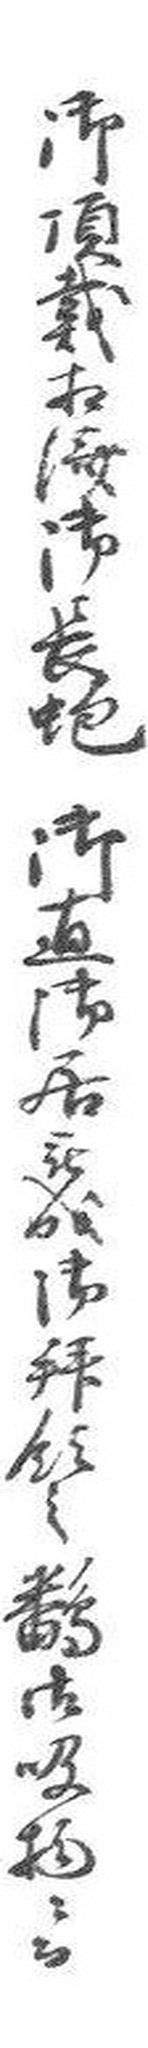御頂戴相済長蚫御直御居被成御拝領之鷭御吸物ニ而
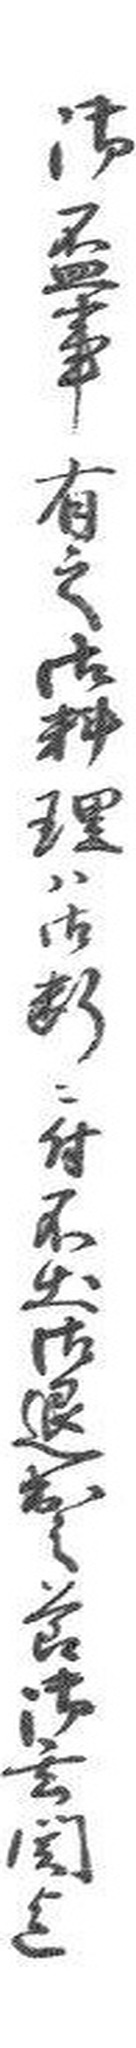御盃事有之御料理ハ御断ニ付不出御退出之節御玄関迄
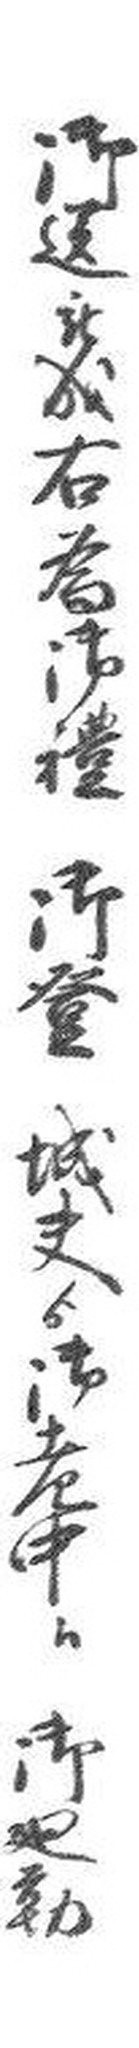御送被成右為御礼御登城夫ゟ御老中江御廻勤
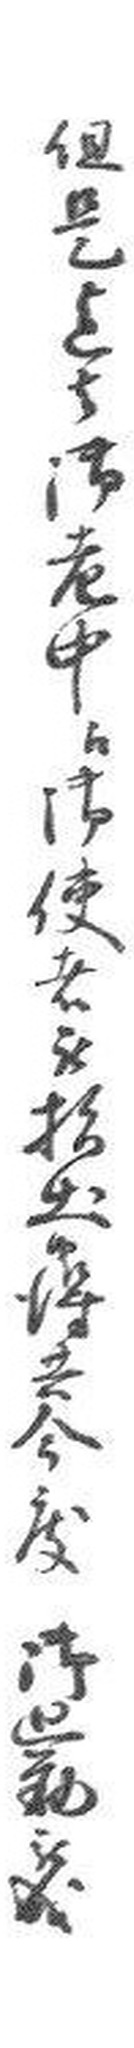但是迄御老中江御使者被指出候得共今度御廻勤被成
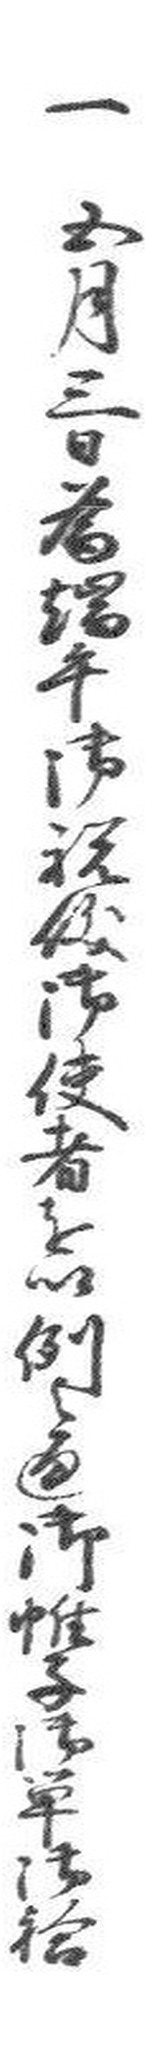一五月三日為端午御祝儀御使者を以例之通御帷子御単御袷
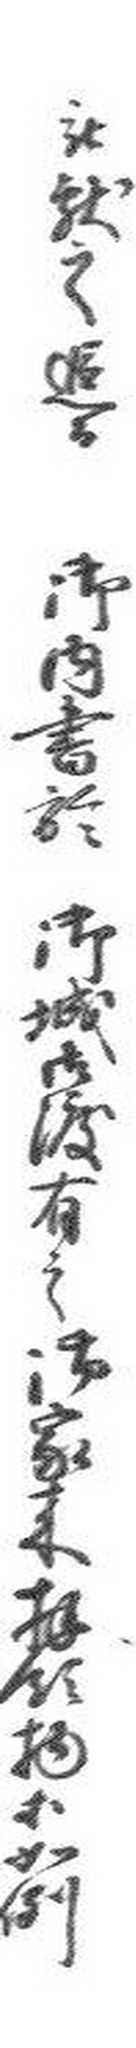被献之追而御内書於御城御渡有之御家来拝領物等如例
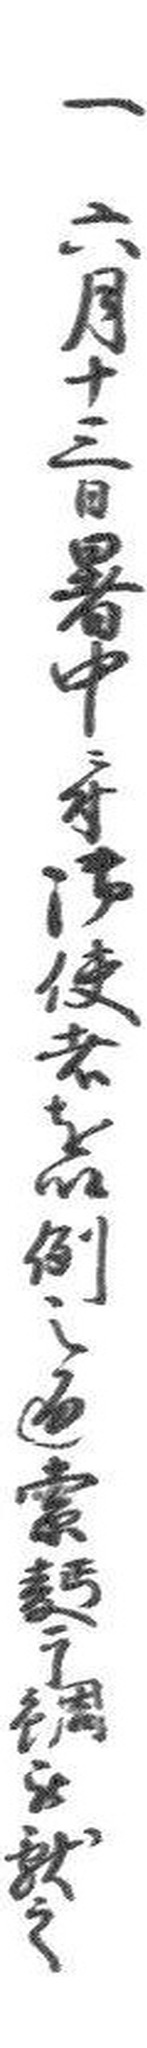一六月十三日暑中ニ付御使者を以例之通素麵干鯛被献之
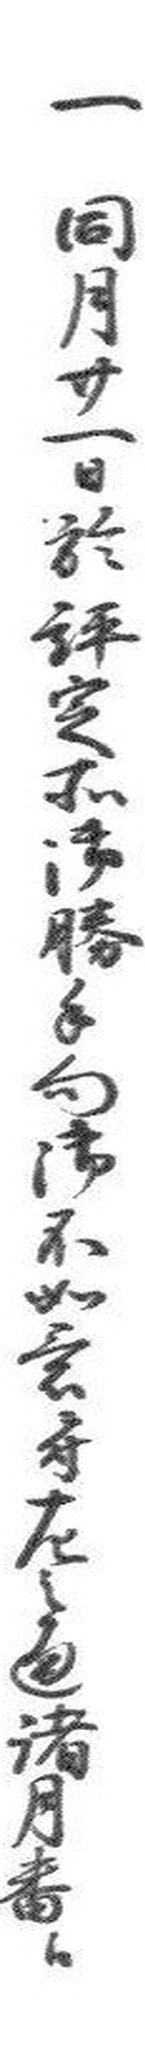一同月廿一日評定所御勝手向御不如意ニ付左之通諸月番江
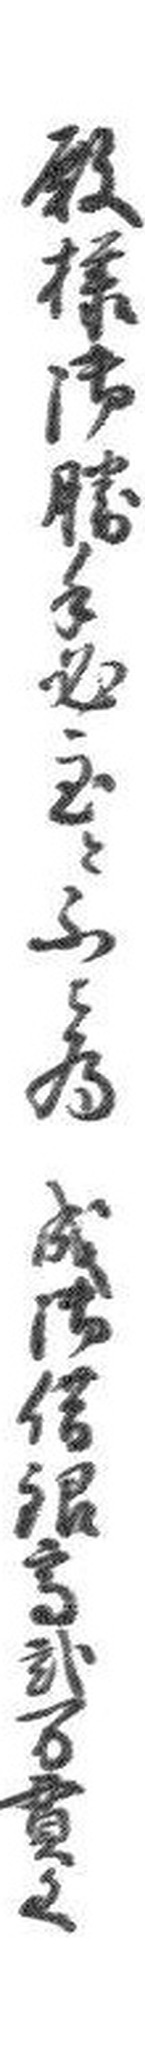殿様御勝手必至とふ被為成御借銀高弐万貫
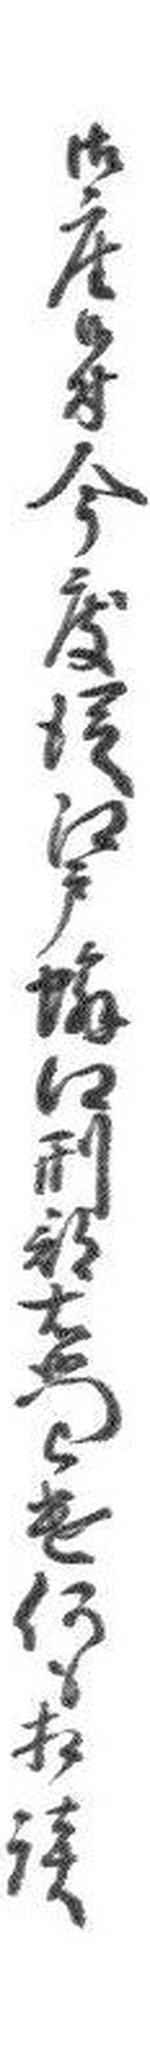御座候ニ付今度従江戸江刑部右衛門被遣何も相談
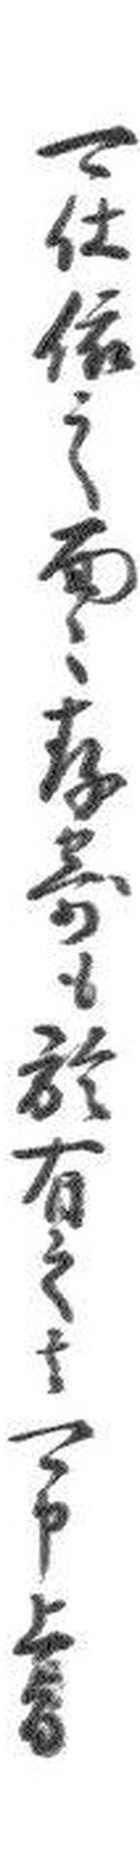可仕依之面々存寄も於有之者可申上旨
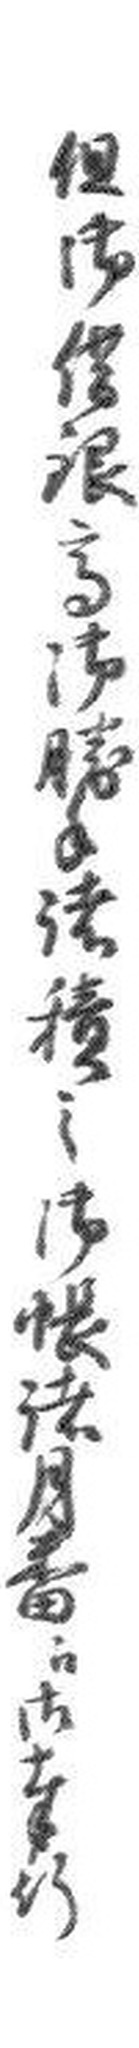但御借銀高御勝手諸積之御帳諸月番江御奉行
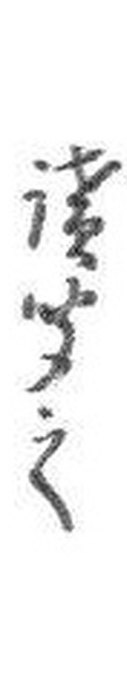読聞之
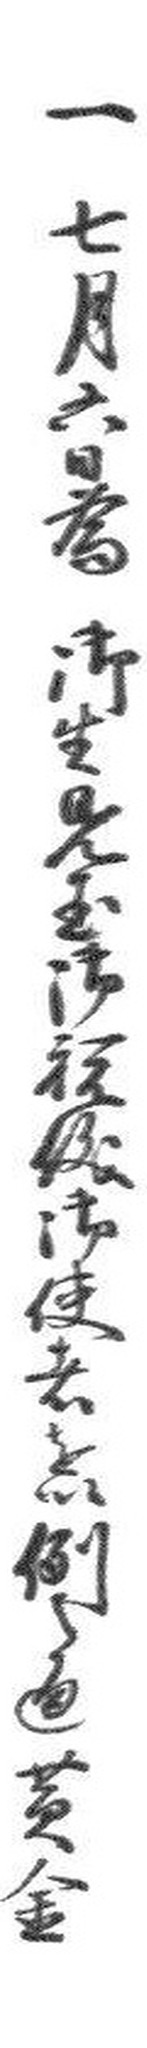一七月六日為御生見玉御祝儀御使者を以例之通黄金

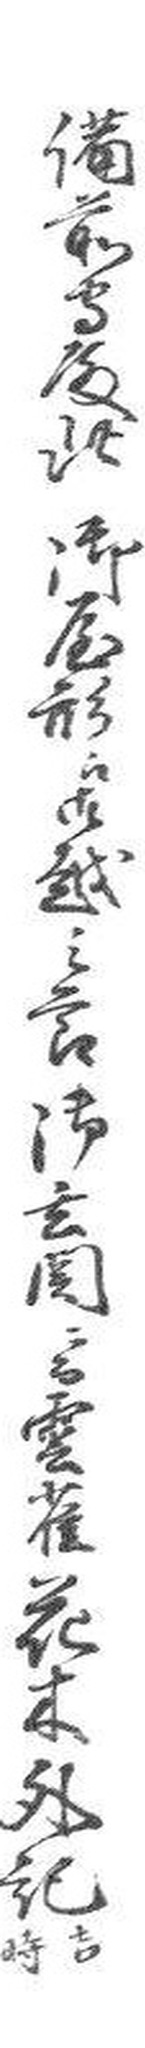備前守殿此御屋形江御越之節御玄関ニ而雲雀花木外記時
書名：家譜 十一 昌親公 従延宝二年到延宝四年八月
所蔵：福井県文書館 Fukui Prefectural Archives
